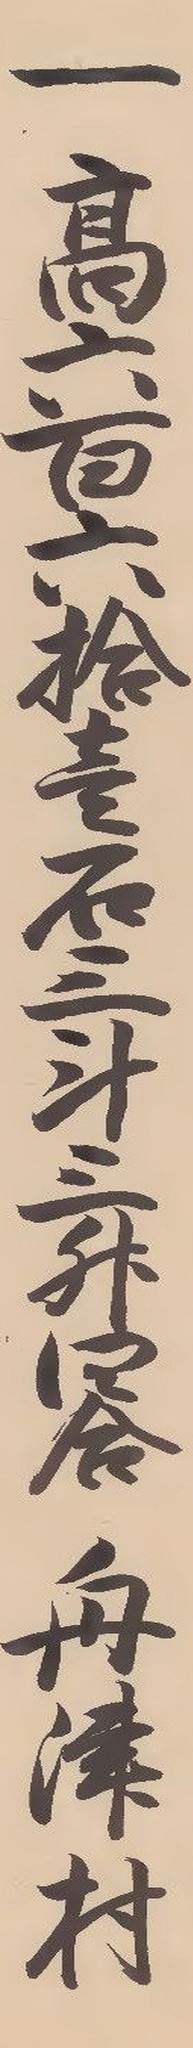一高六百六拾壱石三斗三升四合舟津村
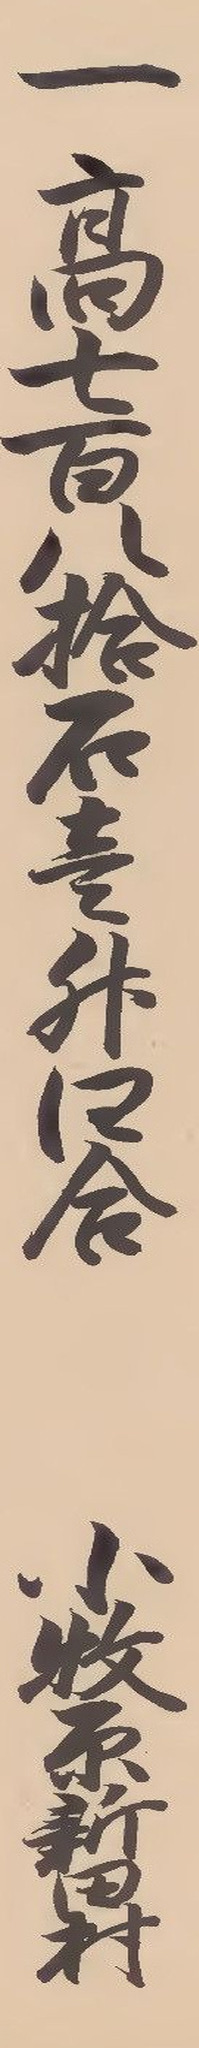一高七百八拾石壱升四合小牧原新田村
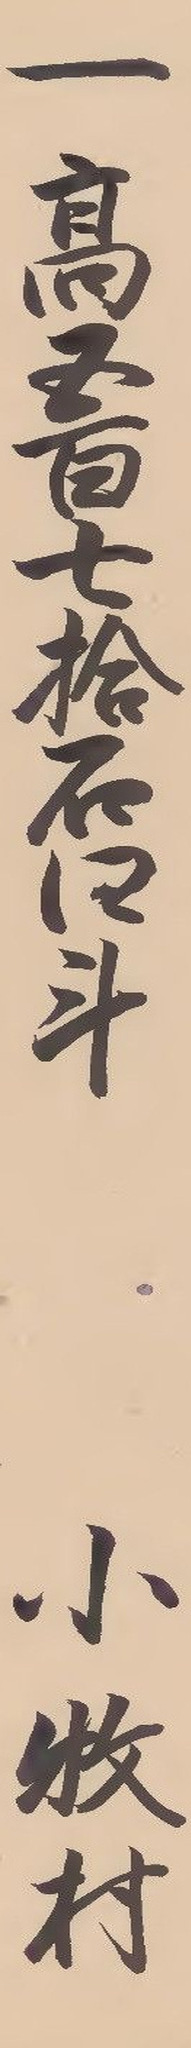一高五百七拾石四斗小牧村

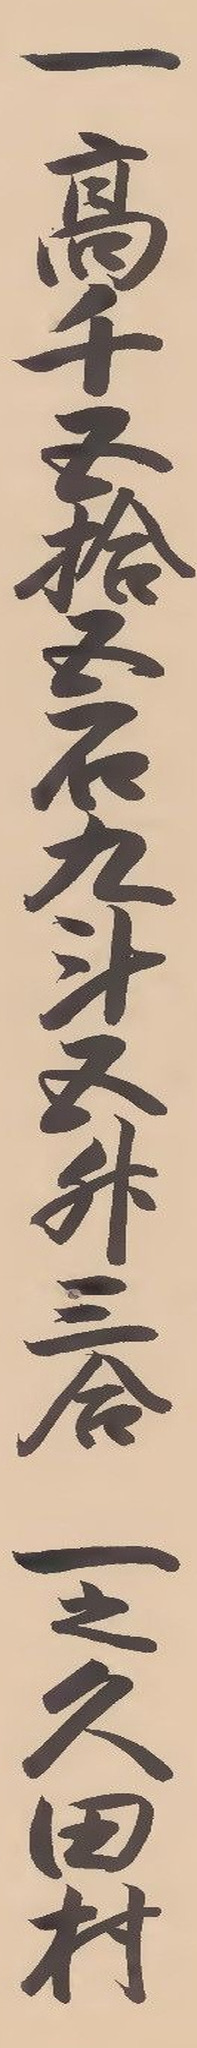一高千五拾五石九斗五升三合一之久田村
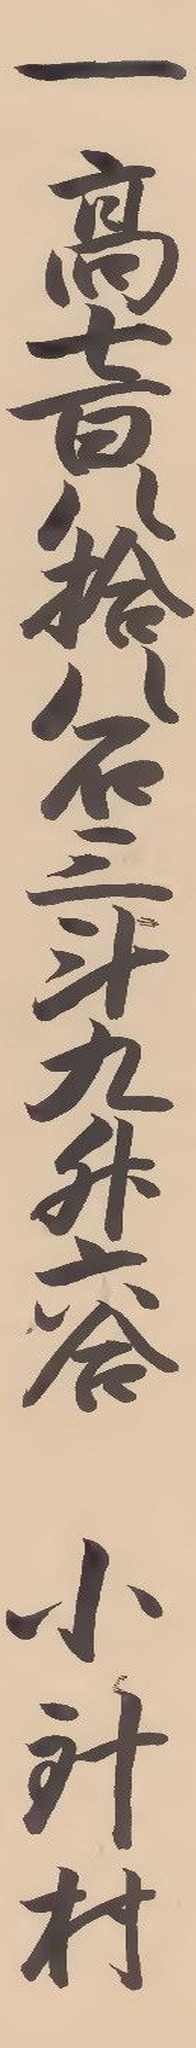一高七百八拾八石三斗九升六合小針村
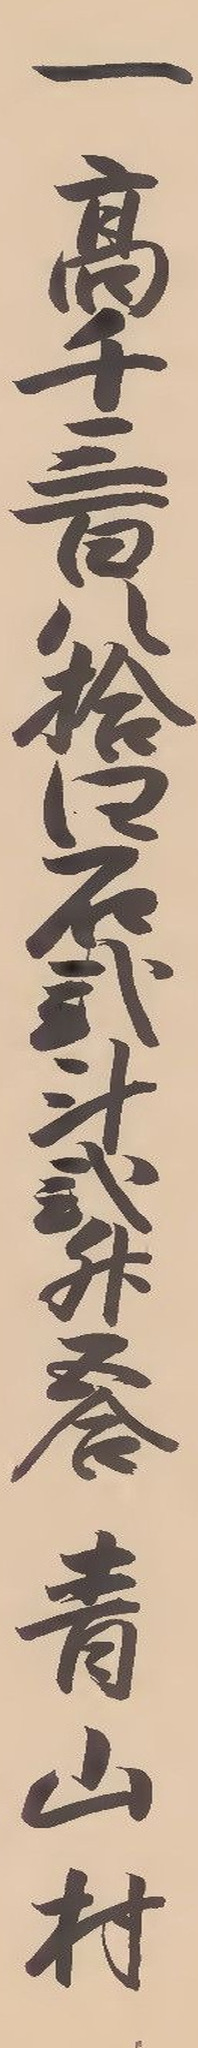一高千三百八拾四石弐斗弐升五合青山村
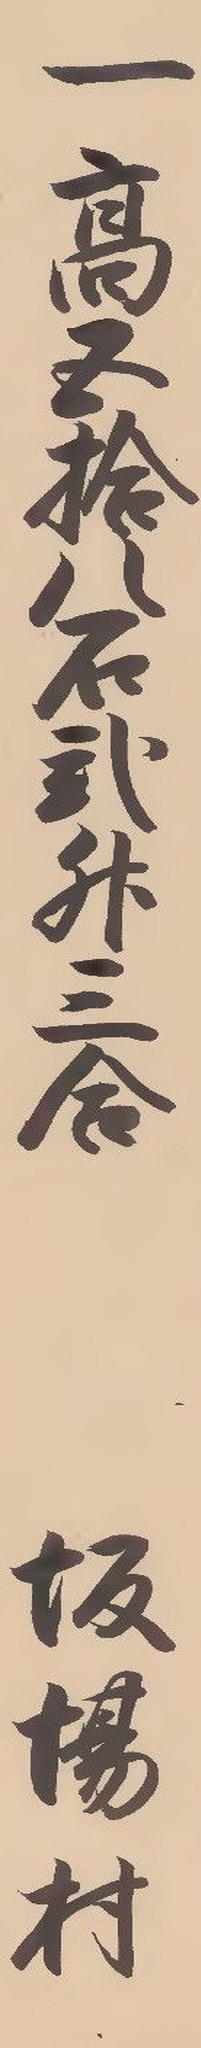一高五拾八石弐升三合坂場村
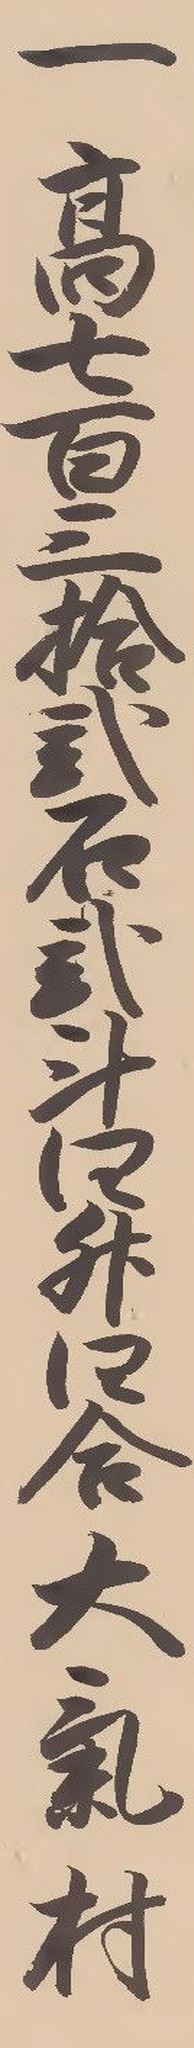一高七百三拾弐石弐斗四升四合大気村
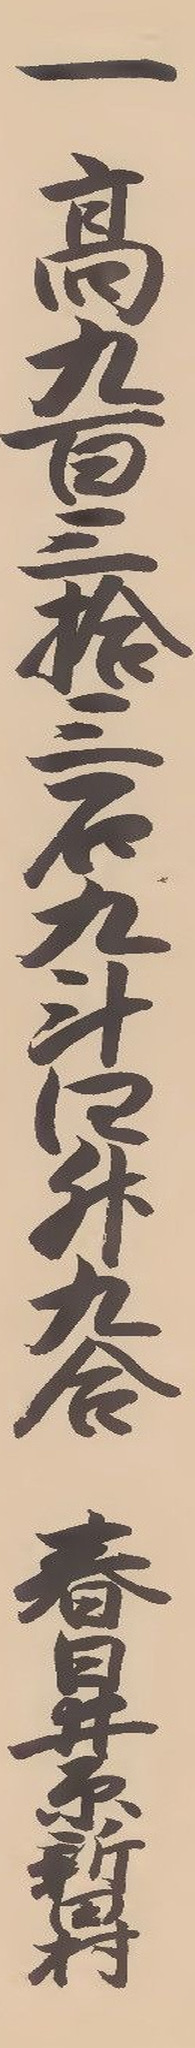一高九百三拾三石九斗四升九合春日井原新田村
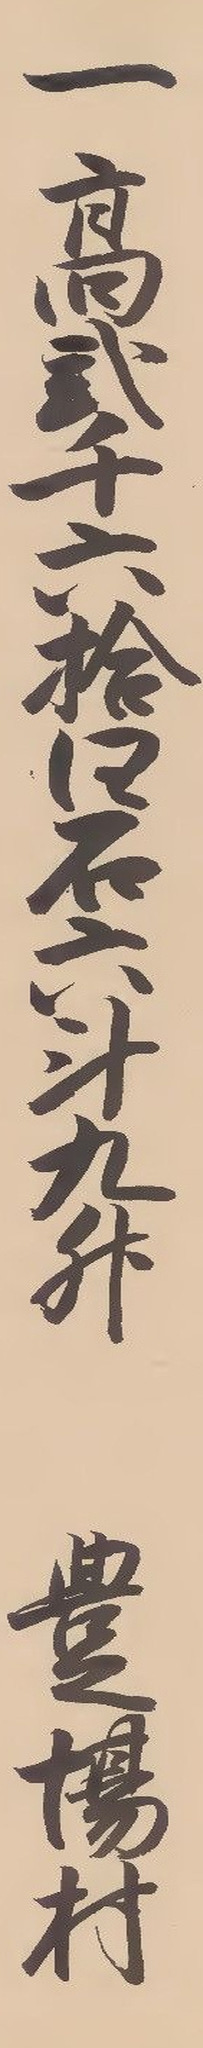一高弐千六拾四石六斗九升豊場村
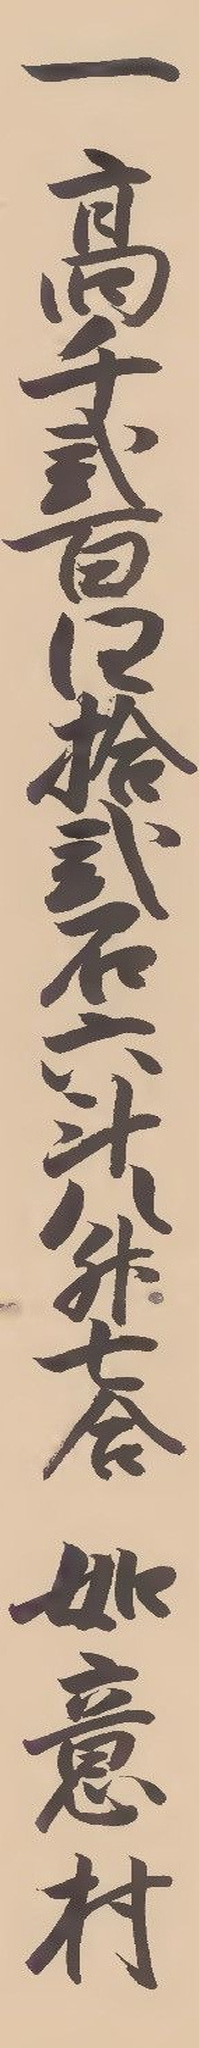一高千弐百四拾弐石六斗八升七合如意村

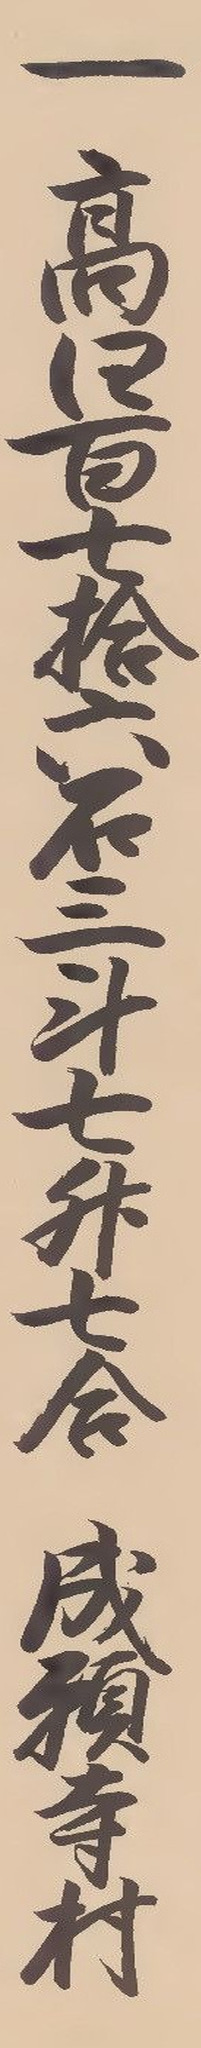一高四百七拾六石三斗七升七合成願寺村
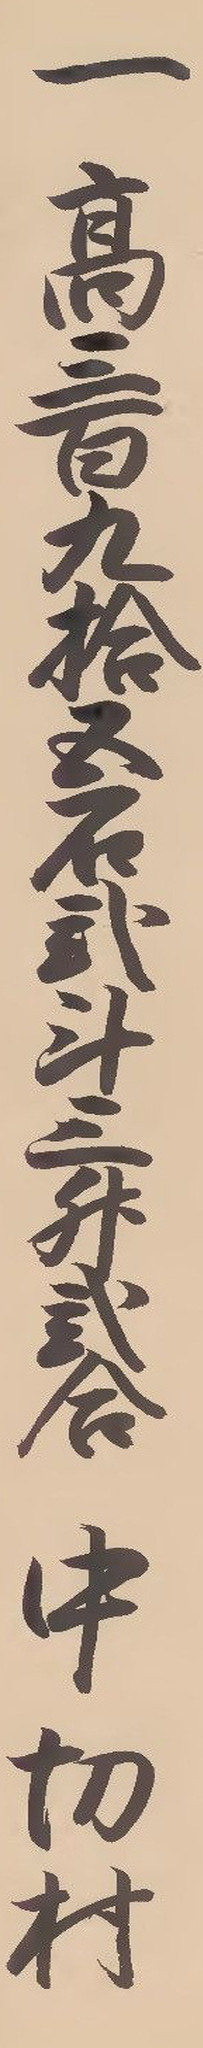一高三百九拾五石弐斗三升弐合中切村
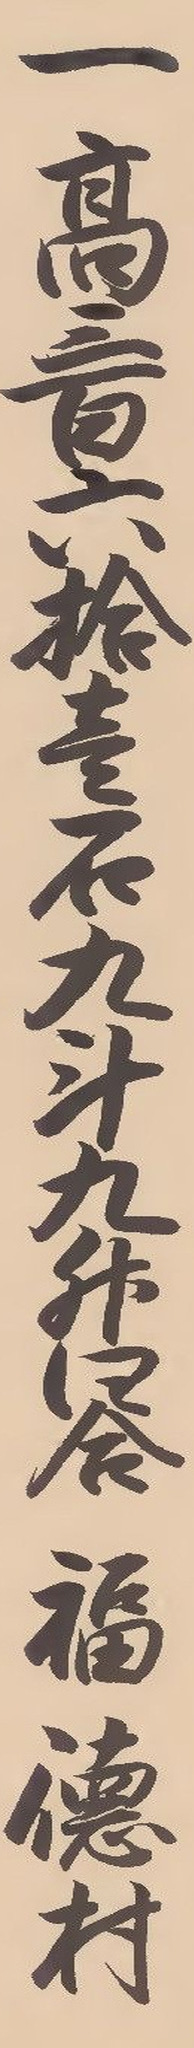一高三百六拾壱石九斗九升四合福徳村
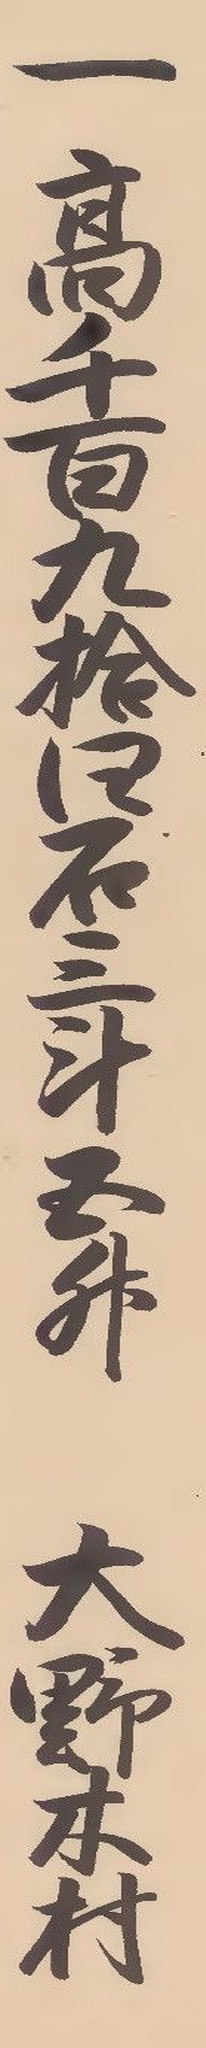一高千百九拾四石三斗五升大野木村
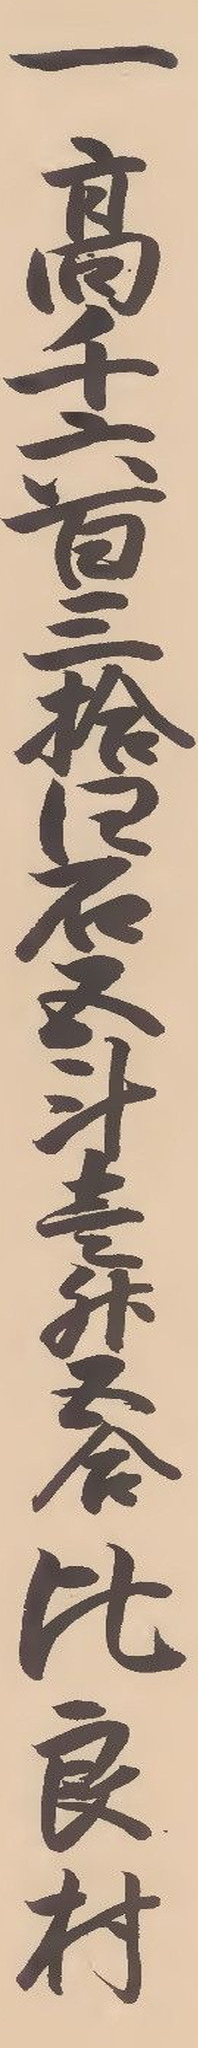一高千六百三拾四石五斗壱升五合比良村
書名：尾張国郷帳
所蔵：国立公文書館 National Archives of Japan
